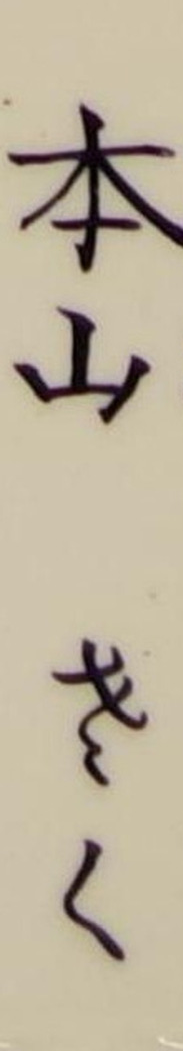本山さく
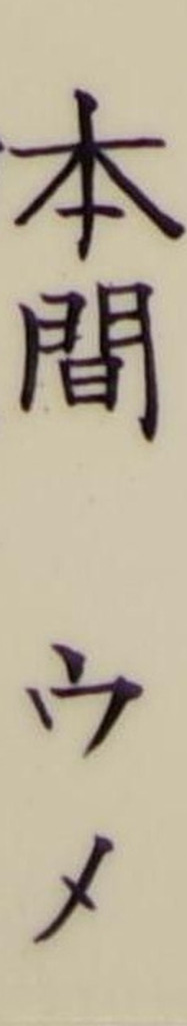本間ウメ
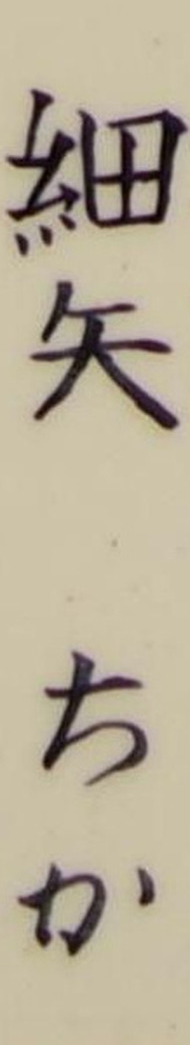細矢ちか
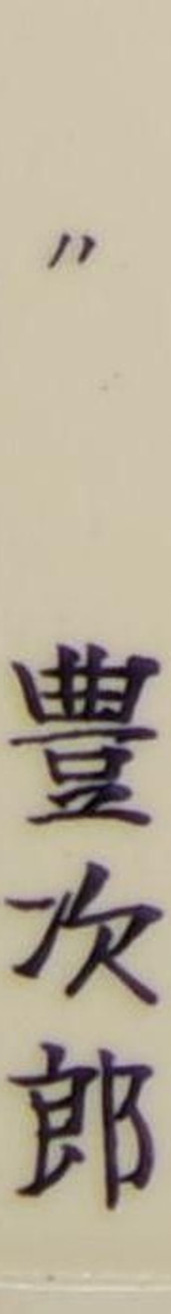豊次郎
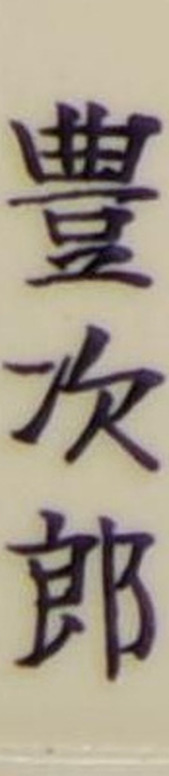豊次郎
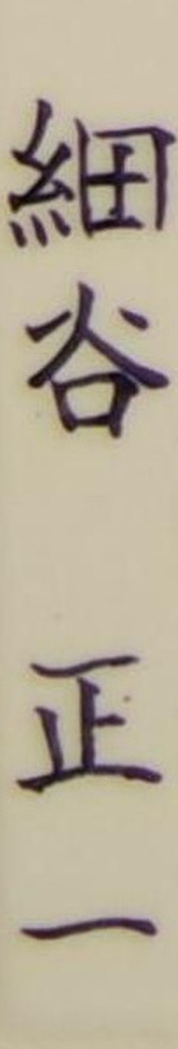細谷正一

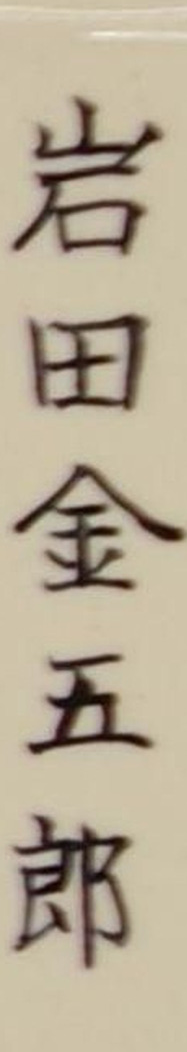岩田金五郎
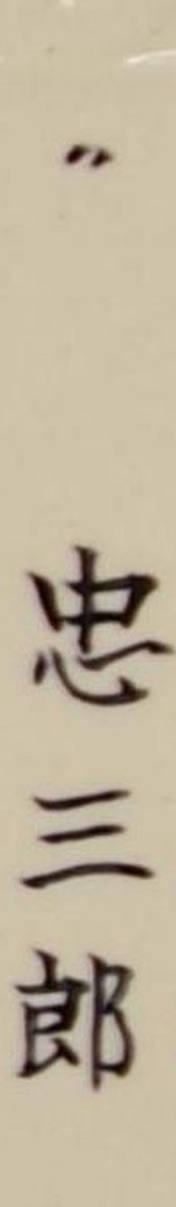忠三郎
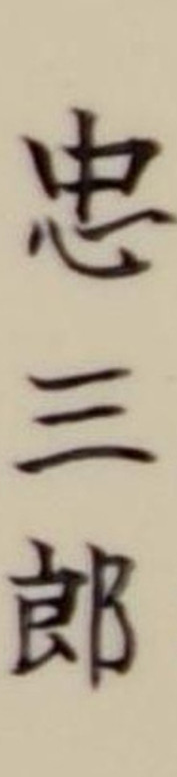忠三郎
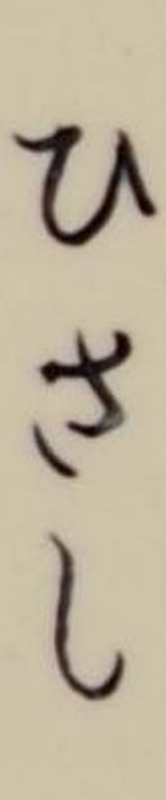ひさし
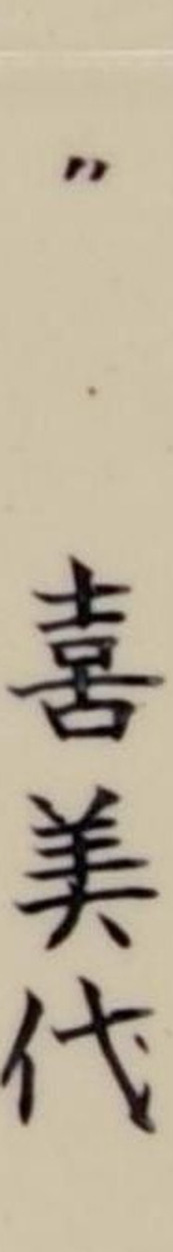喜美代
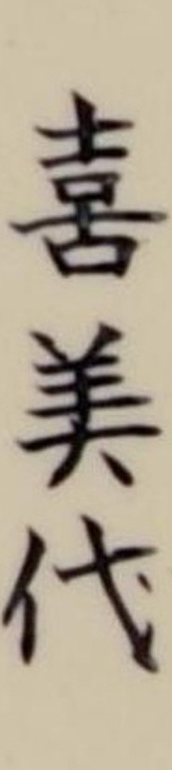喜美代
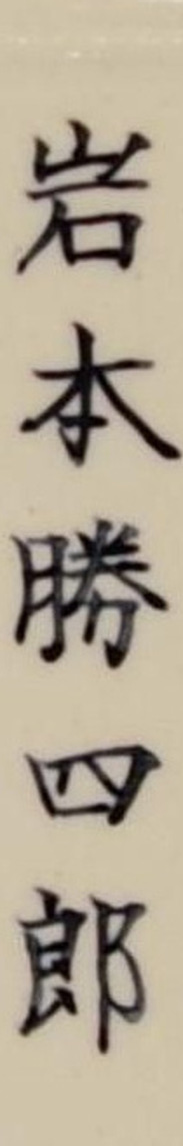岩本勝四郎
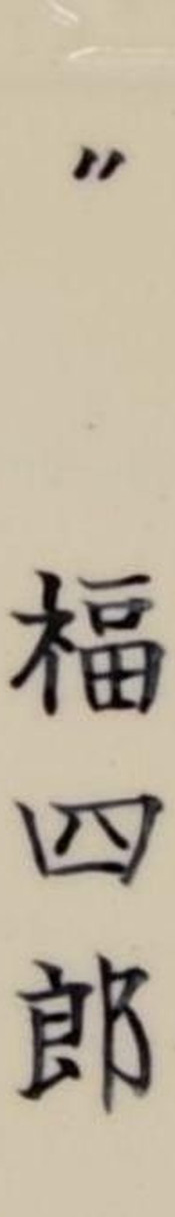福四郎
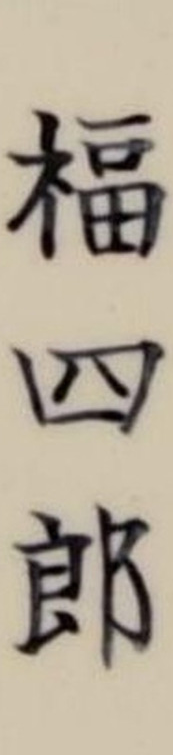福四郎

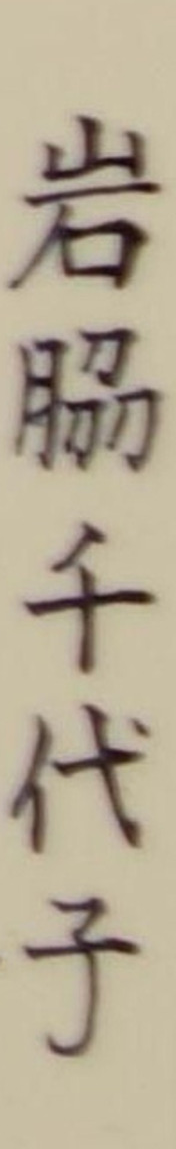岩脇千代子
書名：A~D
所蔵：koyasan kongobuji
